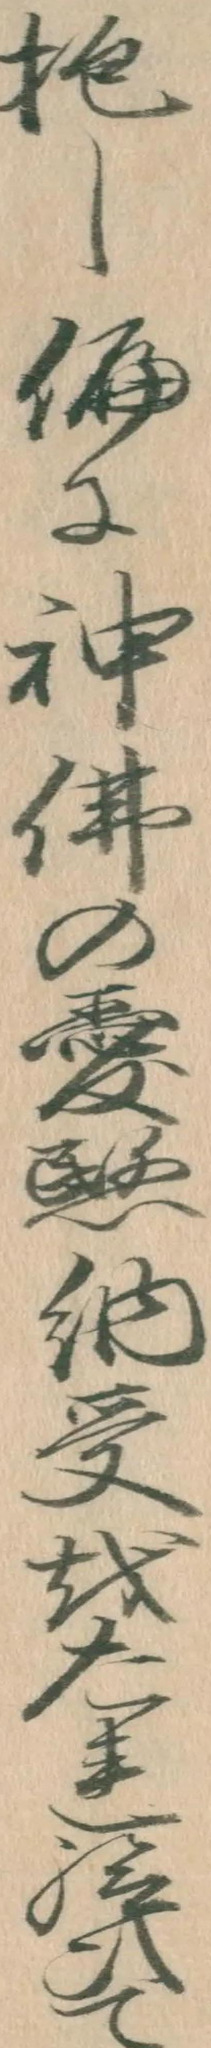抱し偏に神仏の愛愍納受をたれ給ひて
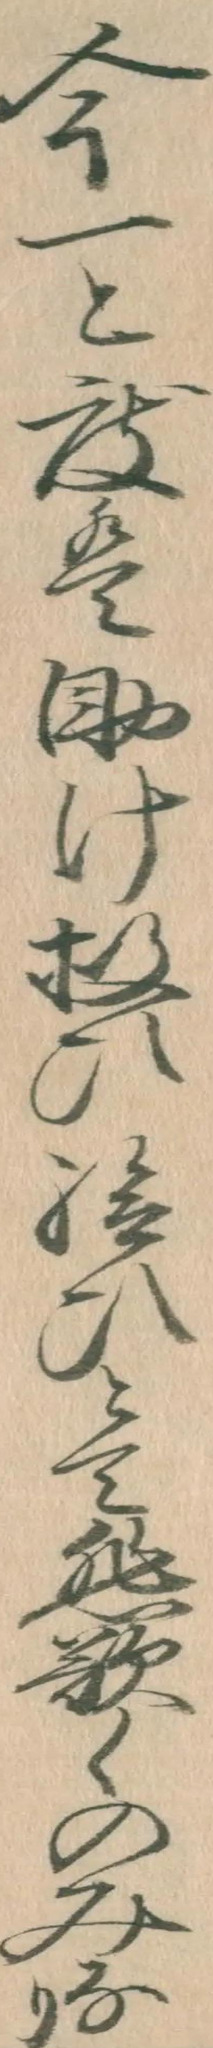今一と度は助け救ひ給ひとて悲歎くのみなり
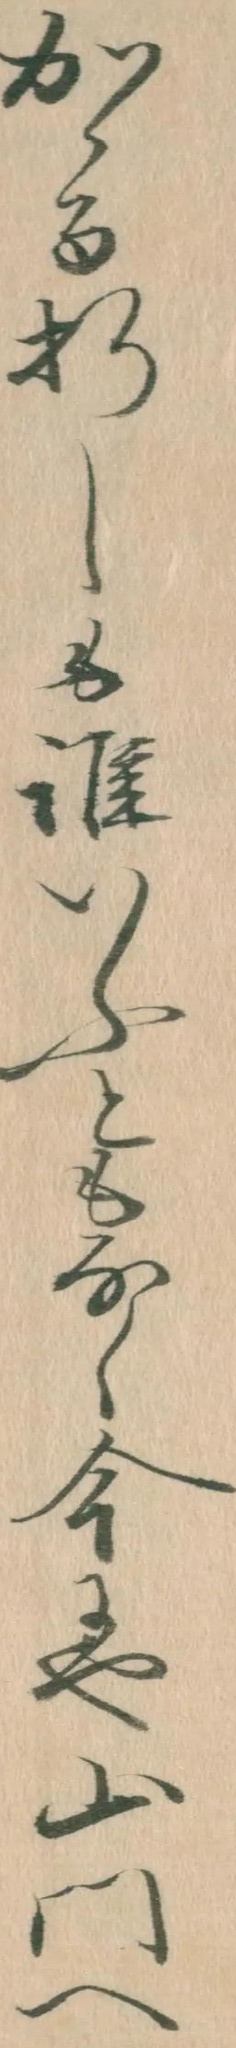かゝる折しも誰いふともなく今や山門へ
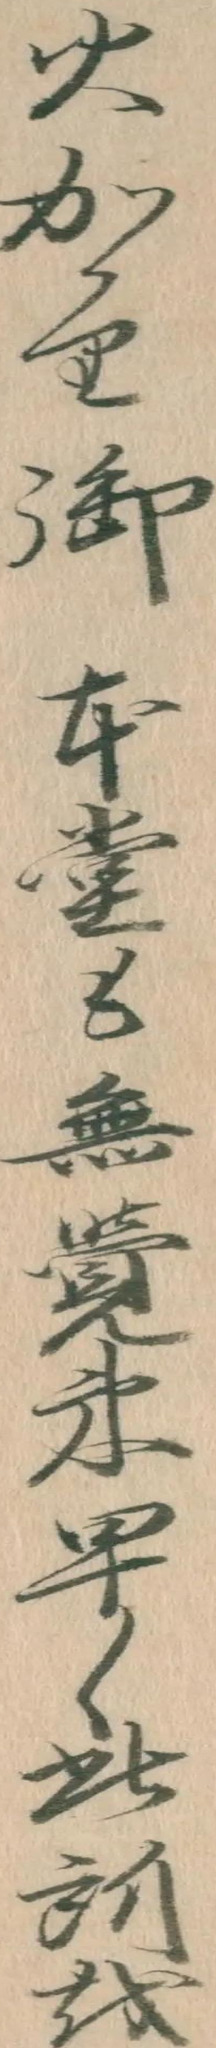火かゝり御本堂も無覚束早く此所を
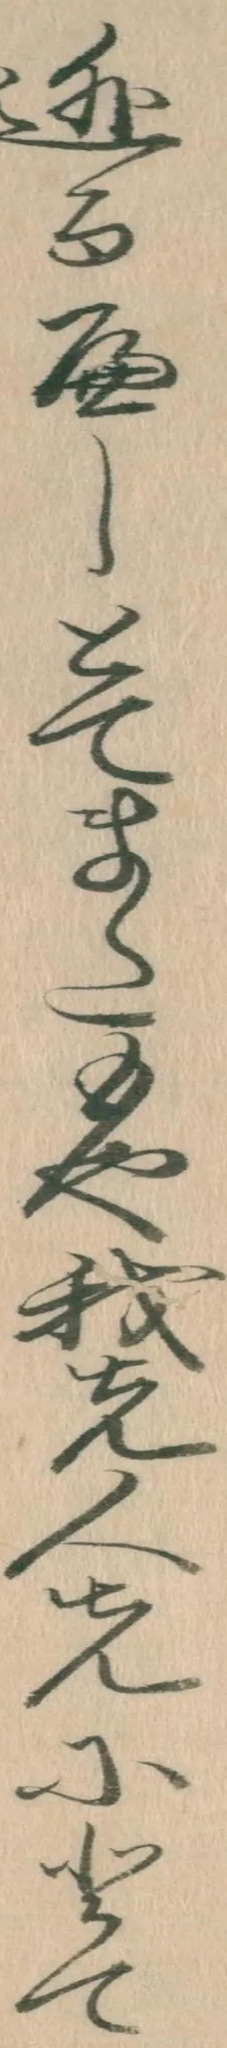逃るへしとてまたもや我先人先にとて
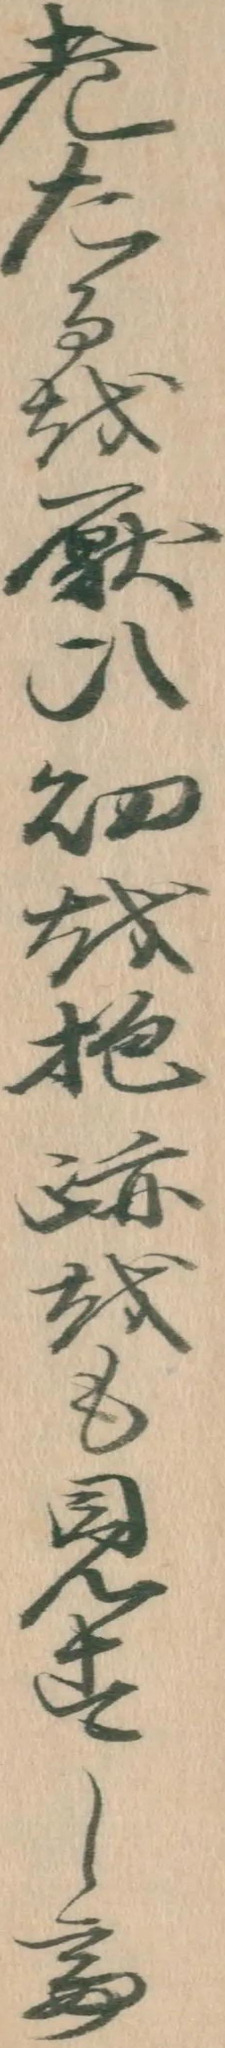老たるを厭ひ幼を抱跡をも見すして
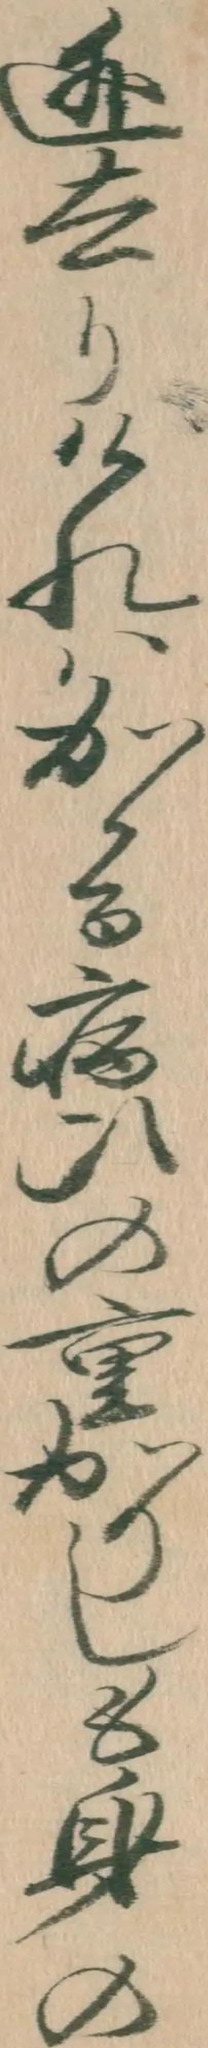逃去りけれはかゝる病ひの重かりしも身の
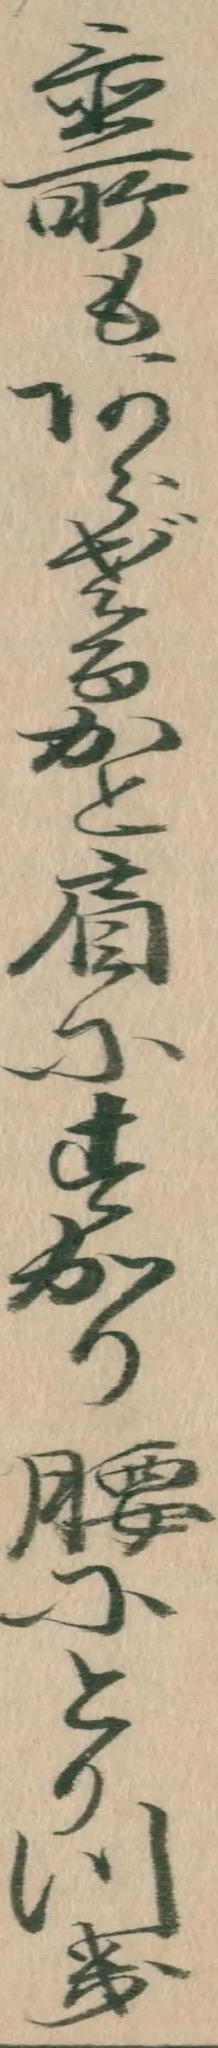置所もあらざるかと肩にすがり腰にとりつき
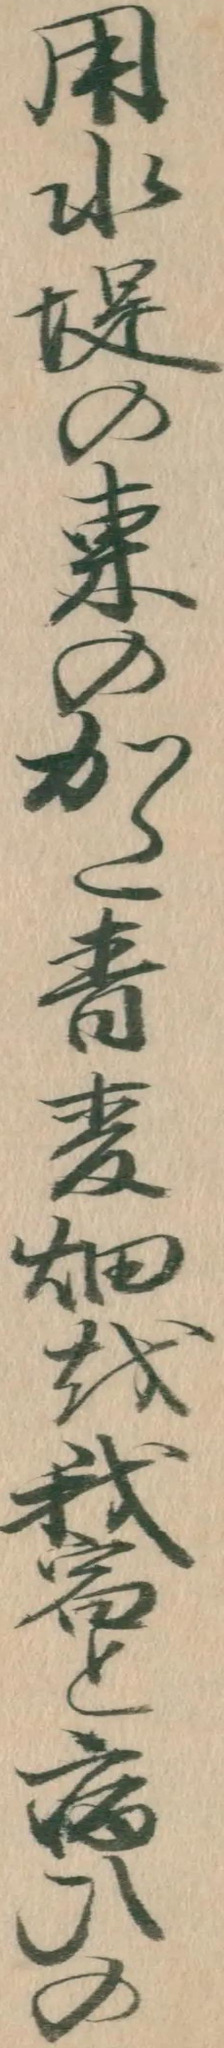用水堤の東のかた青麦畑を我宿と病ひの
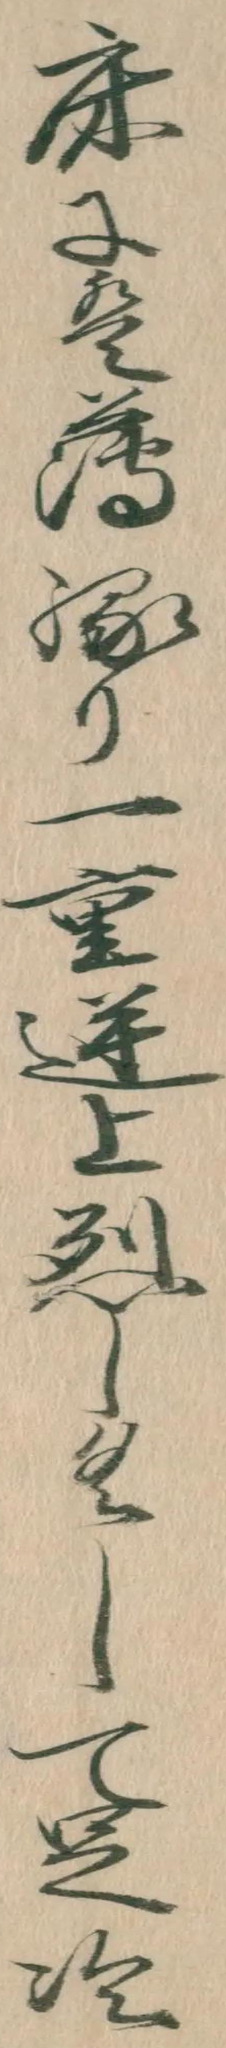床には薄縁り一重逆上烈しくして足冷
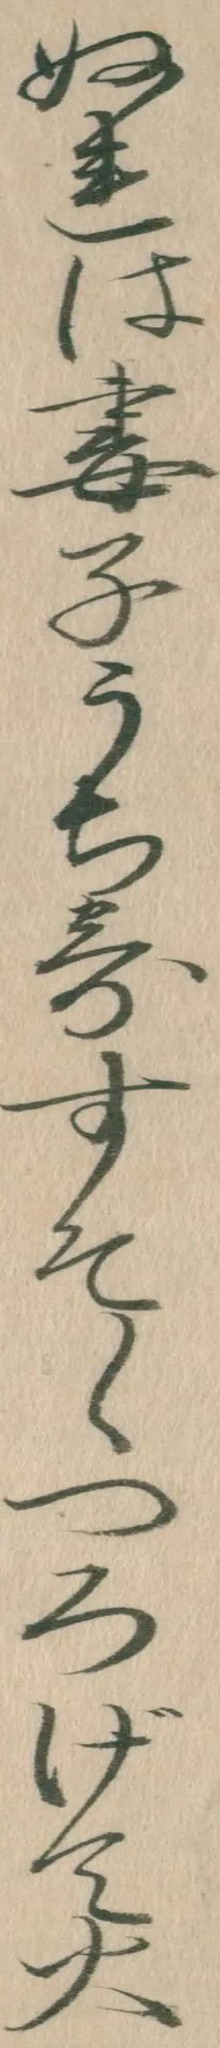ぬれは妻子うち寄すそくつろげて火
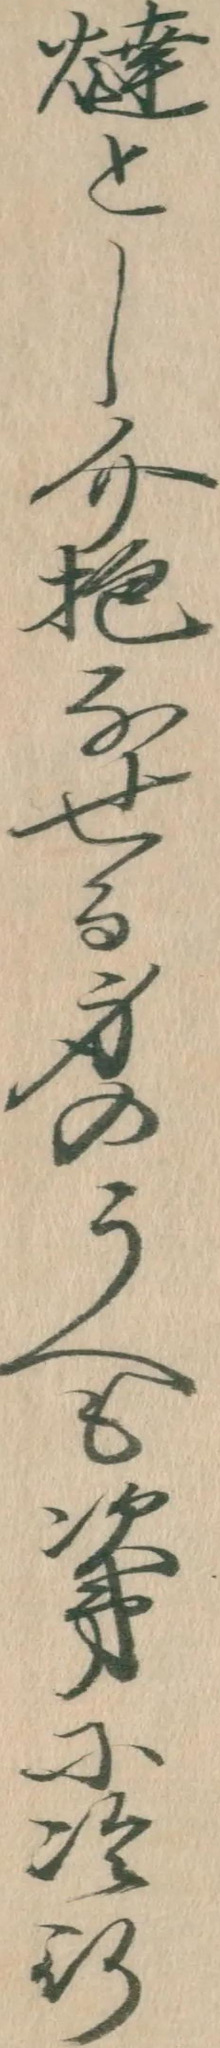燵とし介抱なせる身のうへも次第に冷行
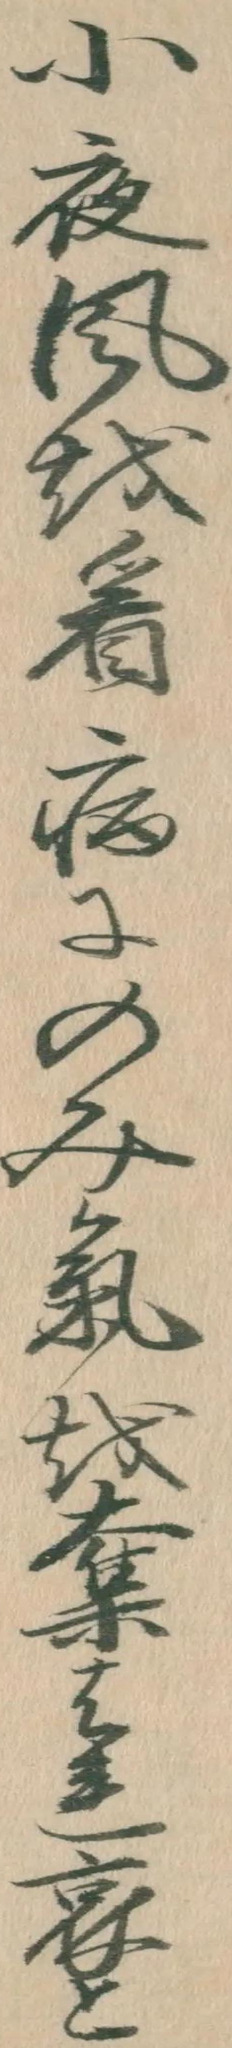に夜風を看病にのみ気を奪はれ哀と
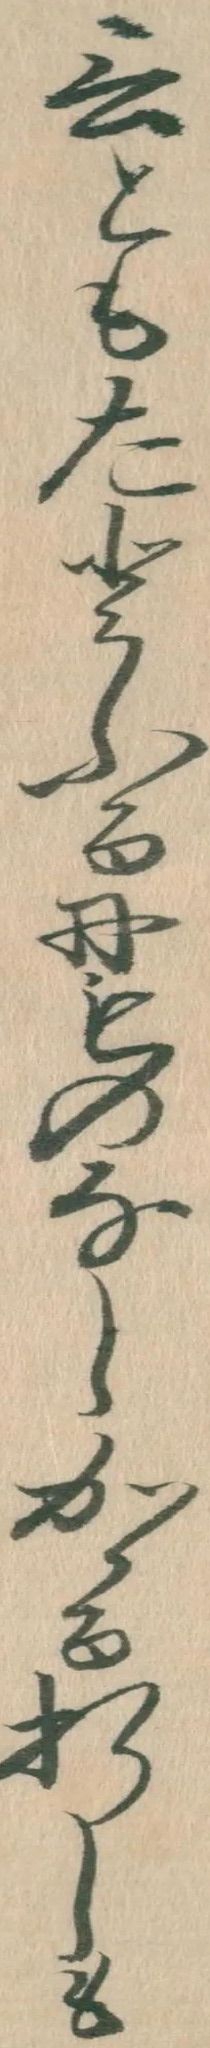云ともたとふるにものなしかゝる折しも
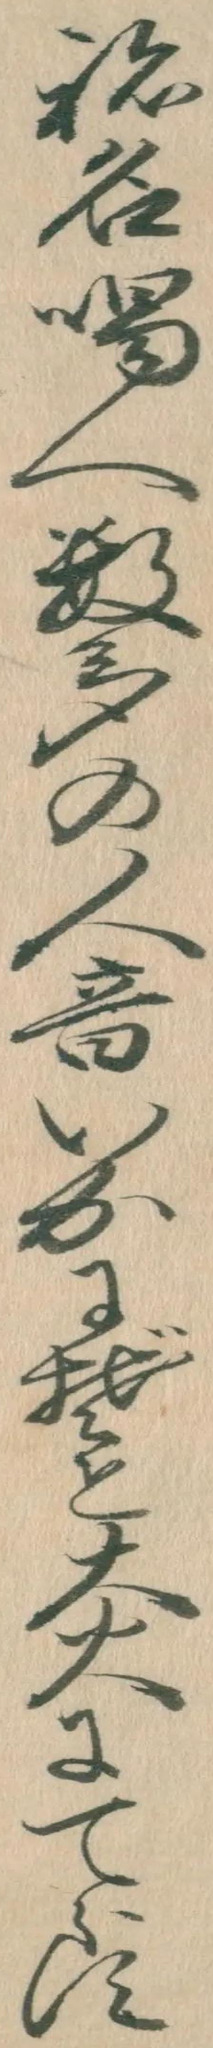称名唱へ数多の人音いかにぞと大火にてらす
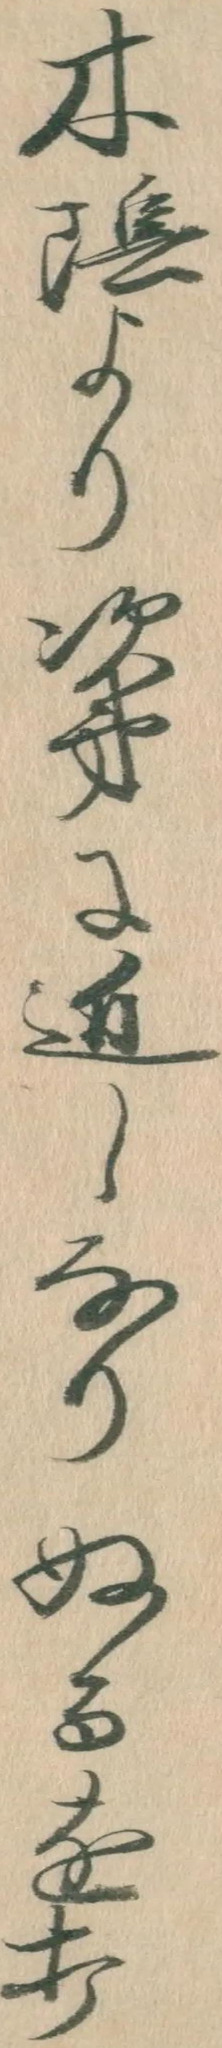木陰より次第に近くなりぬるを打
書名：俗語之種. [3]
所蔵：国立国会図書館 National Diet Library, JAPAN
